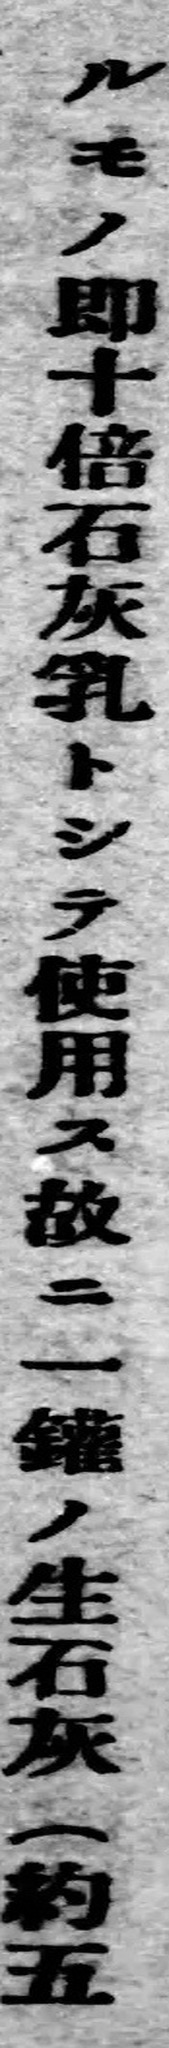ルモノ即十倍石灰乳トシテ使用ス故ニ一鑵ノ生石灰(約五
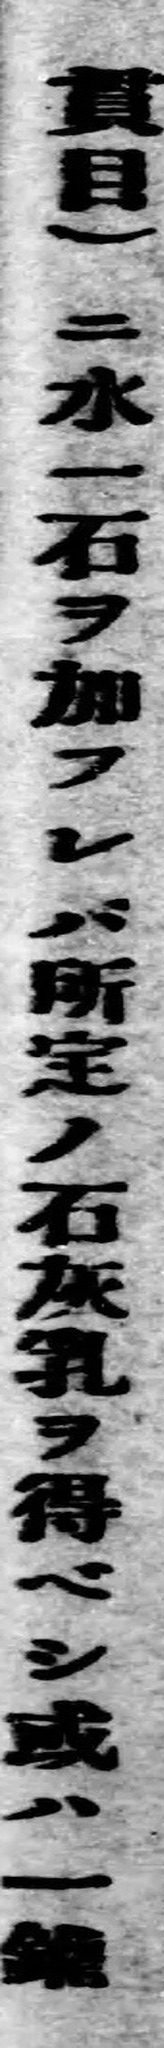貫目)ニ水一石加フレバ所定ノ石灰乳ヲ得ベシ或ハ一鑵
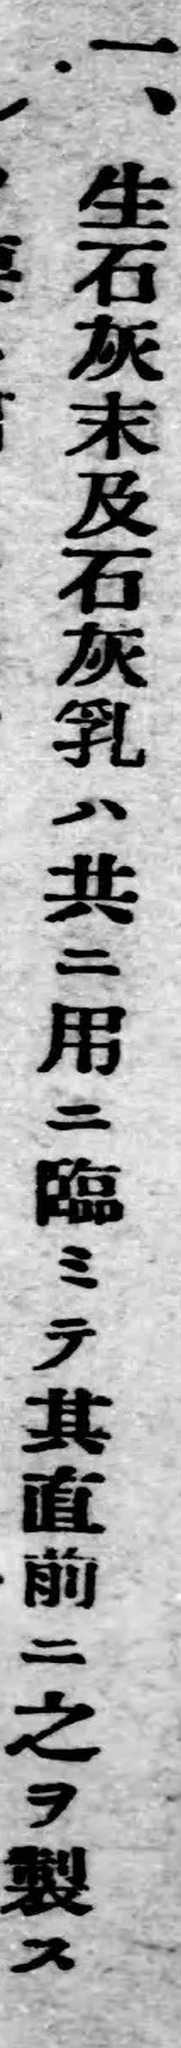一、生石灰末及石灰乳ハ共ニ用ニ臨ミテ其直前ニ之ヲ製ス
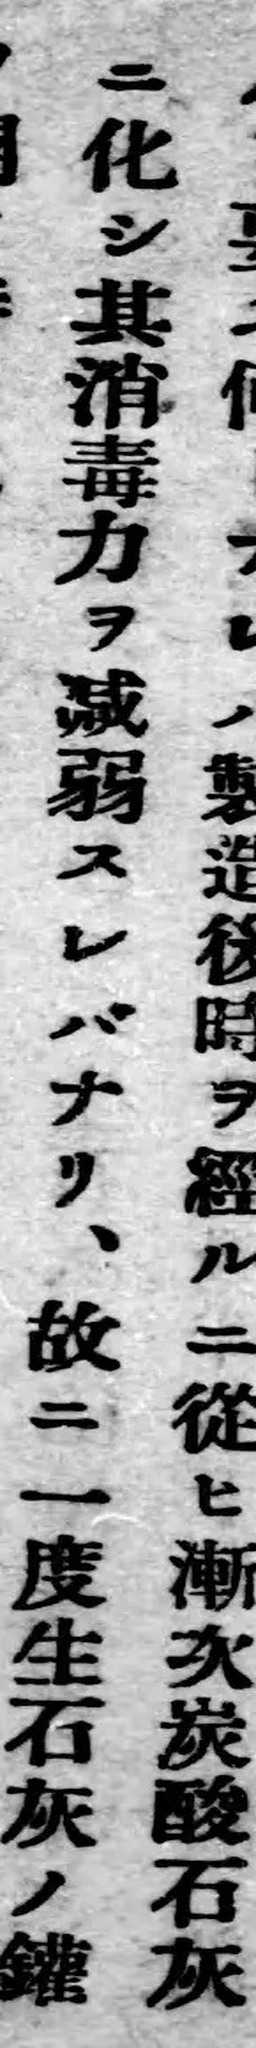ニ化シ其消毒力ヲ減弱スレバナリ、故ニ一度生石灰ノ鑵
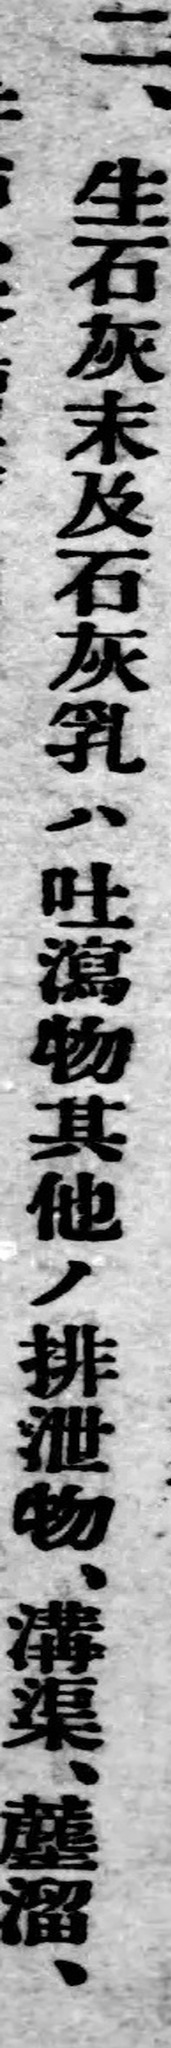二、生石灰末及石灰乳ハ吐瀉物其他ノ排泄物、溝渠、薼溜、
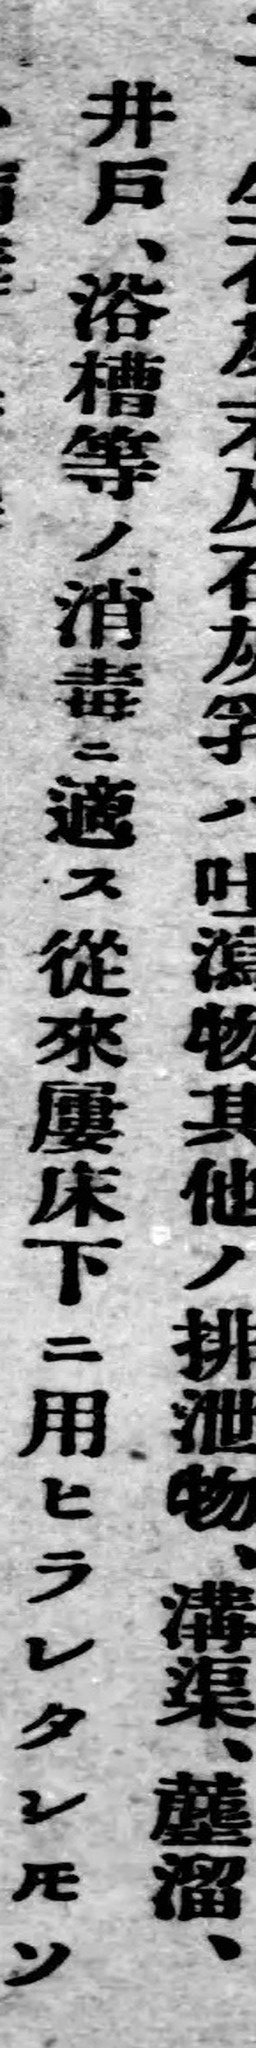井戸、浴槽等ノ消毒ニ適ス從來屢床下ニ用ヒラレタシトモソ

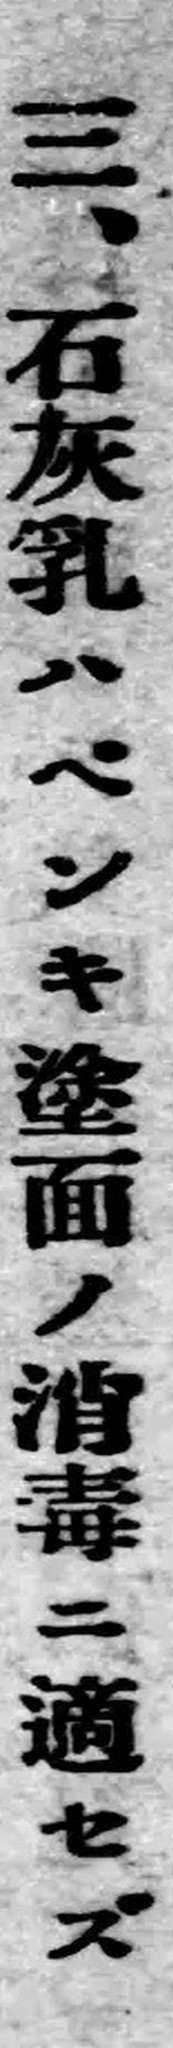三、石灰乳はペンキ塗面の消毒に適せず
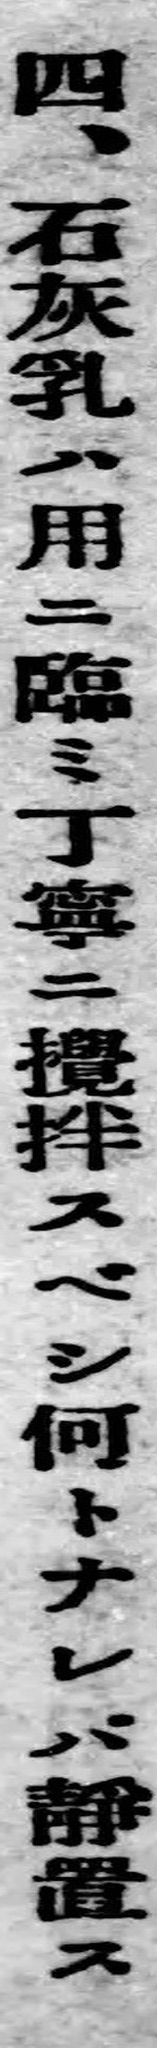四、石灰乳は用に臨み丁寧に攪拌すべし何となれば靜置す
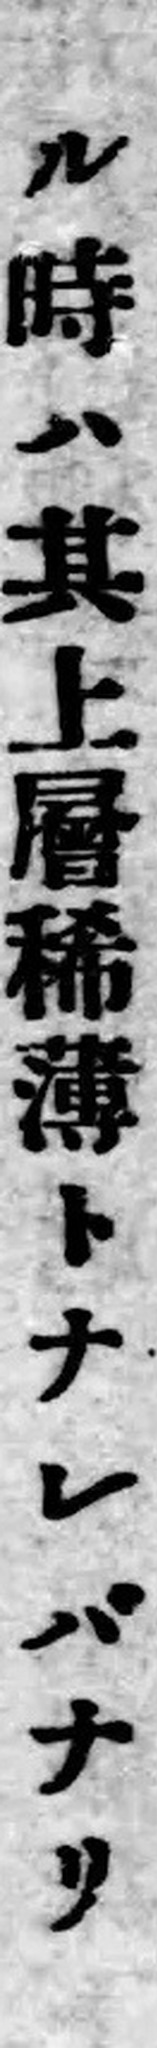る時は其上層稀薄となればなり
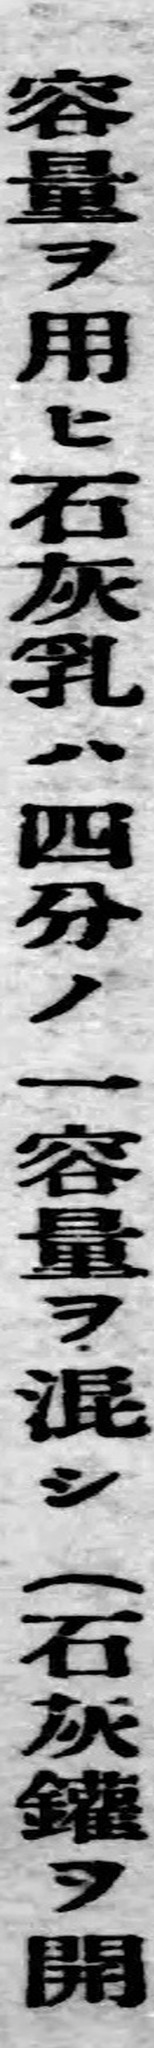容量を用ひ石灰乳は四分の一容量を混し(石灰鑵を開
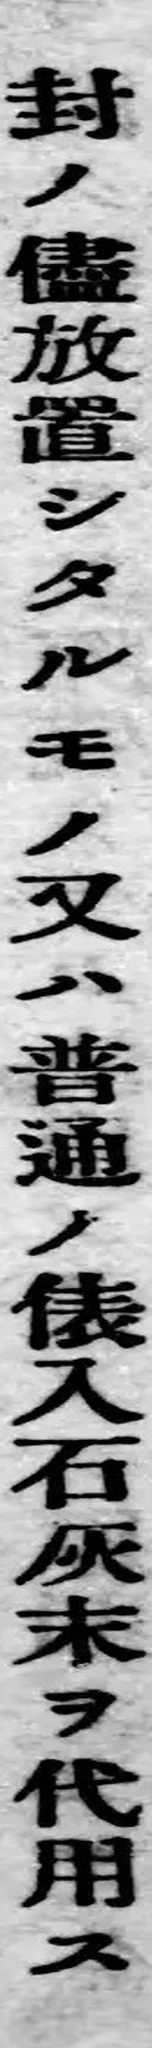封の儘放置したるもの又は普通の俵入石灰末を代用す
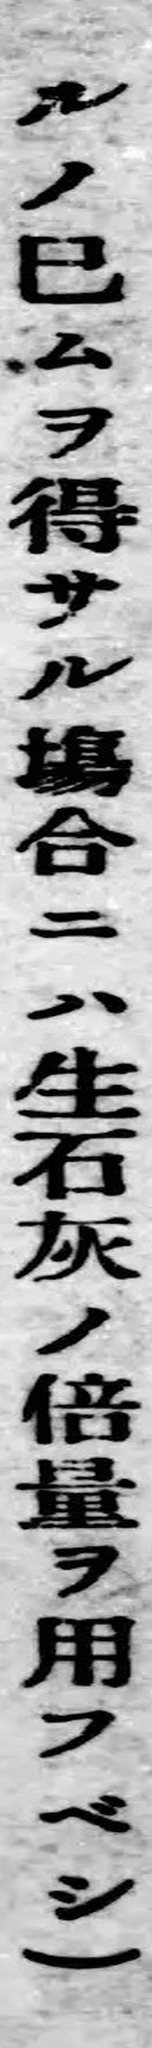るの巳むを得さる塲合には生石灰の倍量を用ふべし)
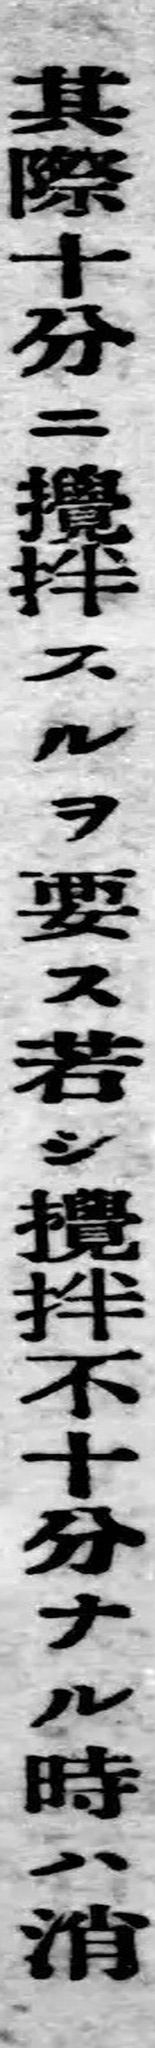其際十分に攪拌するを要す若し攪拌不十分なる時は消
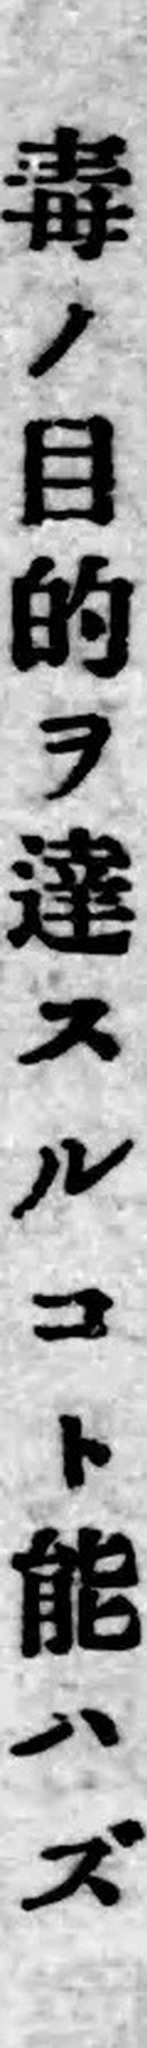毒の目的を達すること能はず
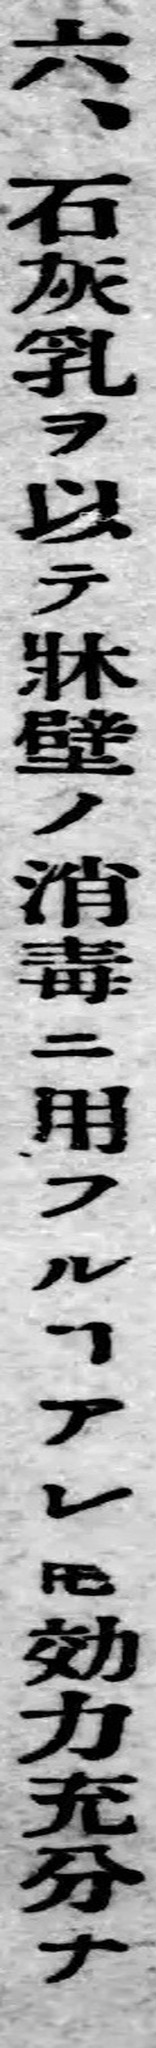六、石灰乳を以て牀壁の消毒に用ふることあれとも効力充分な
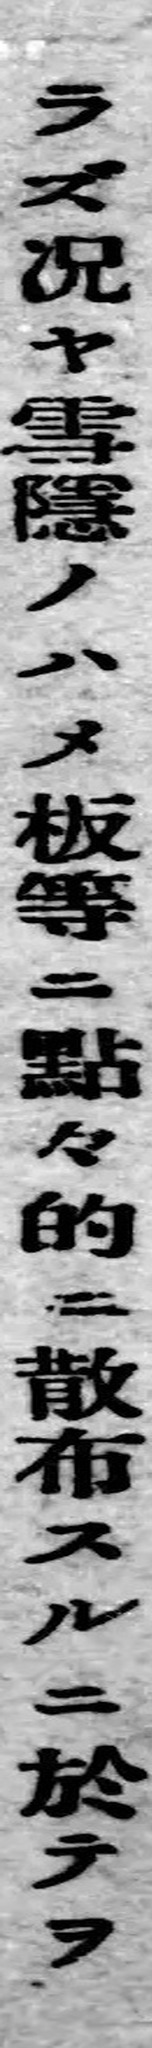らず况や雪隱のはめ板等に點々的に散布するに於てを
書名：袖珍防疫必携
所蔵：国立国会図書館 National Diet Library, JAPAN
